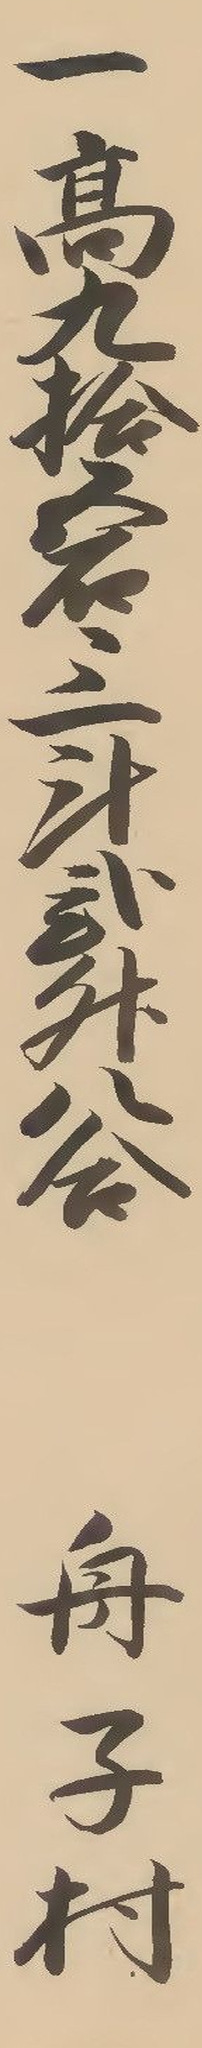一高九拾五石三斗弐升八合舟子村
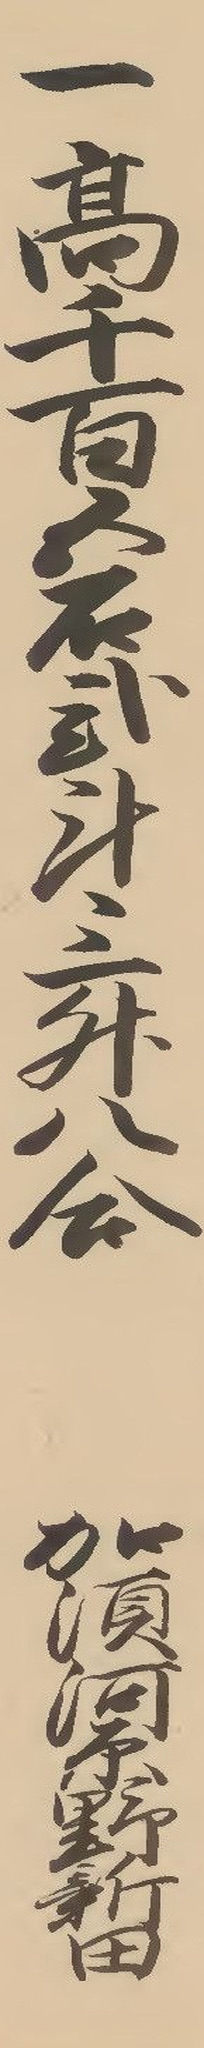一高千百五石弐斗三升八合加須河原野新田
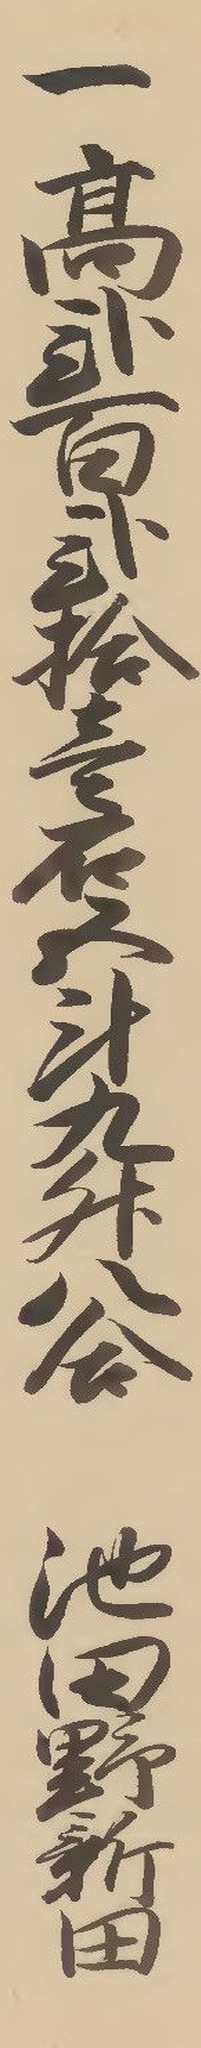一高弐百弐拾壱石五斗九升八合池田野新田
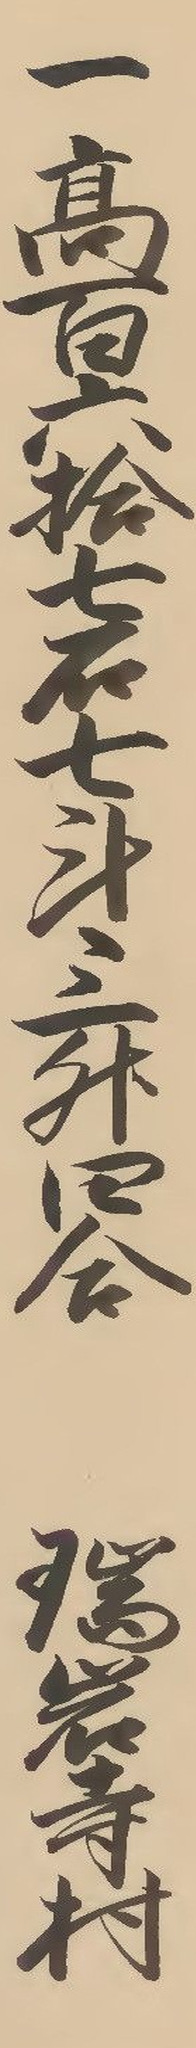一高百六拾七石七斗三升四合瑞岩寺村
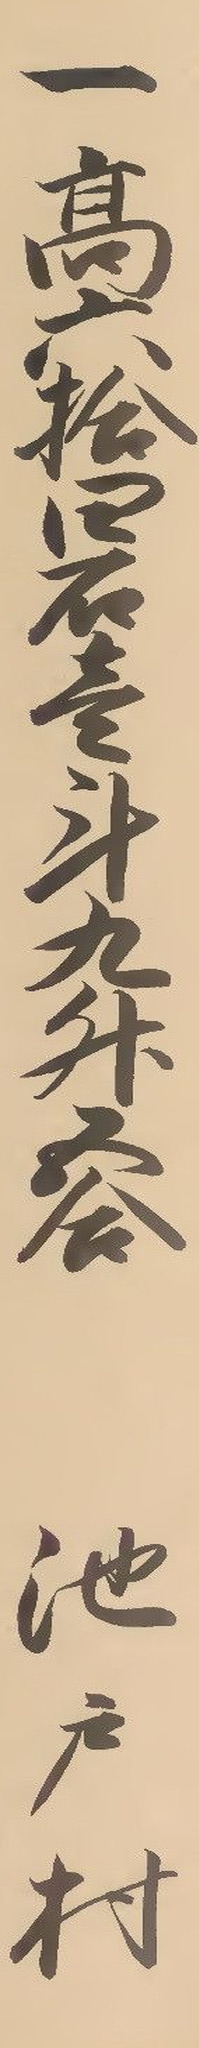一高六拾四石壱斗九升五合池戸村
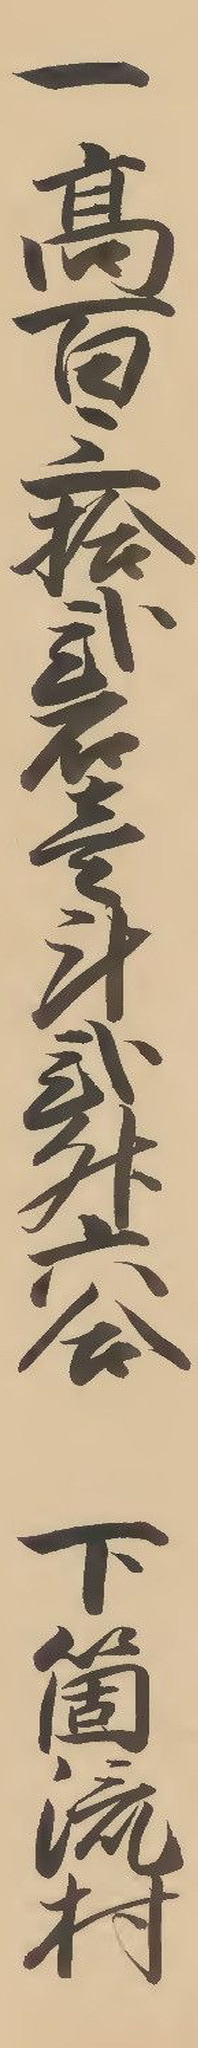一高百三拾弐石壱斗弐升六合下箇流村
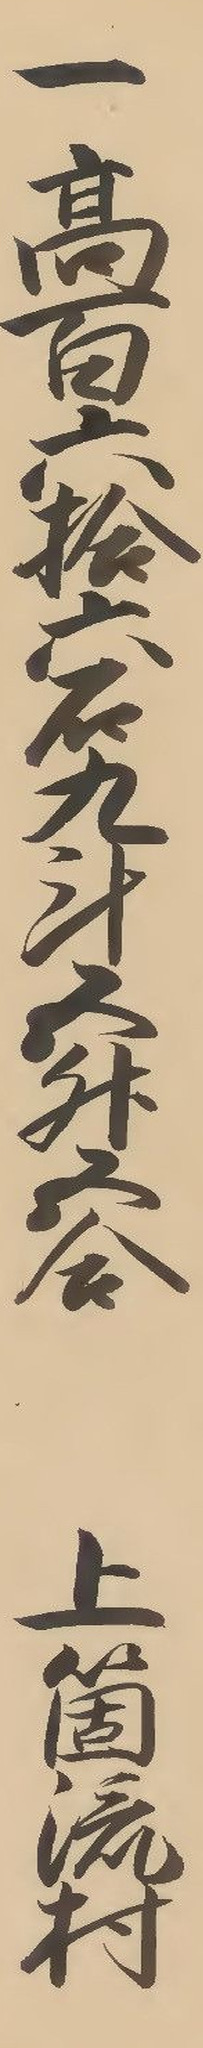一高百六拾六石九斗五升五合上箇流村
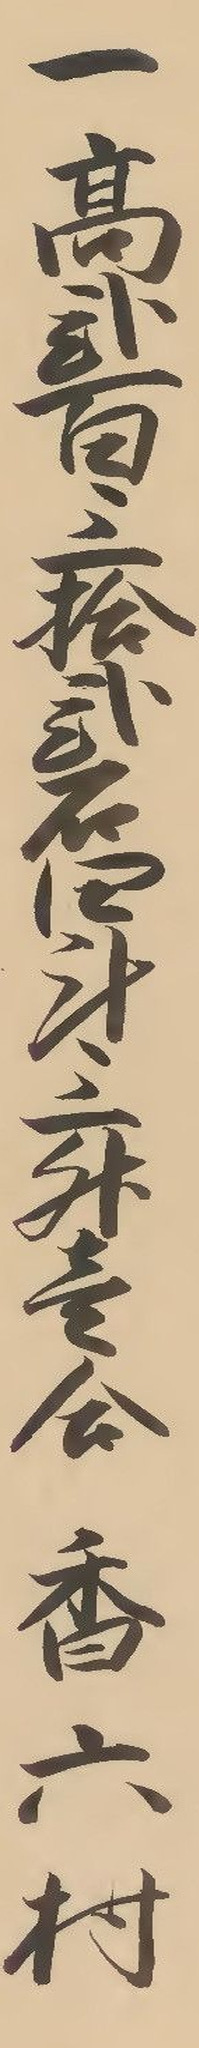一高弐百三拾弐石四斗三升壱合香六村

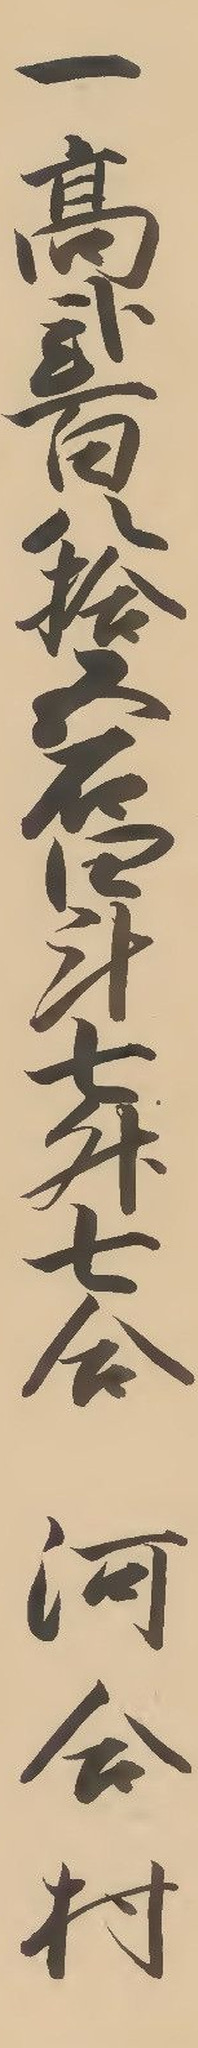一高弐百八拾五石四斗七升七合河合村
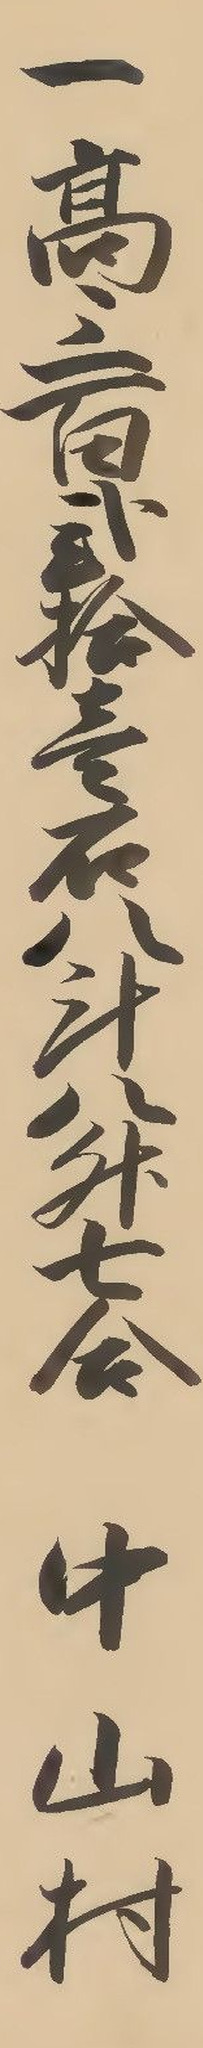一高三百弐拾壱石八斗八升七合中山村
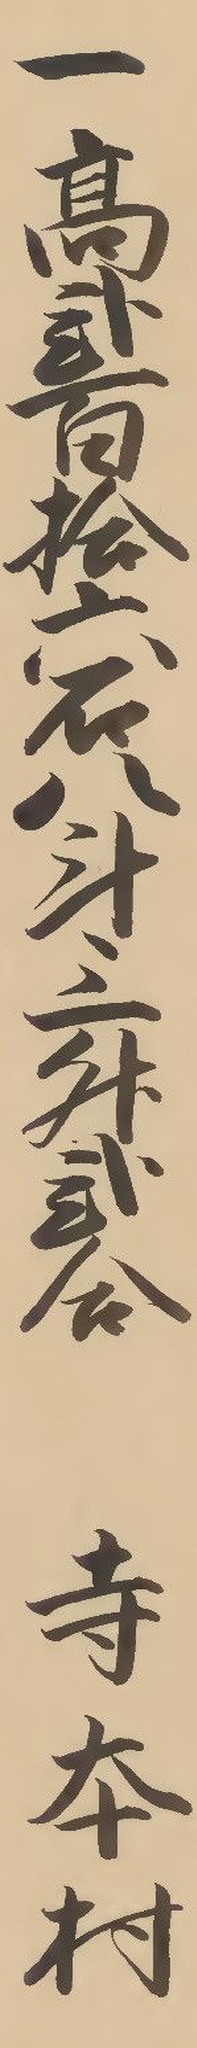一高弐百拾六石八斗三升弐合寺本村
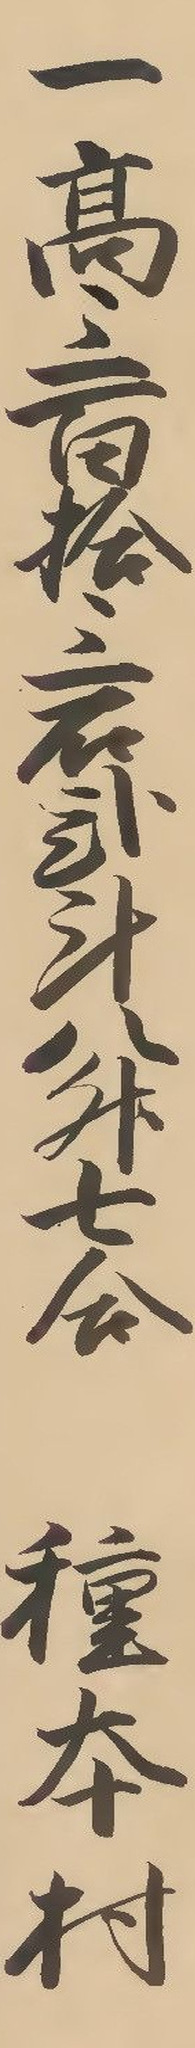一高三百拾三石弐斗八升七合種本村
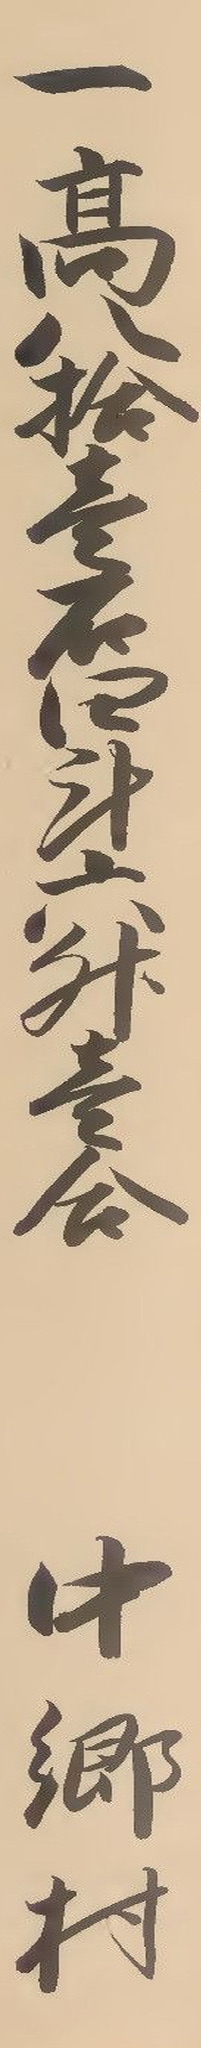一高八拾壱石四斗六升壱合中郷村
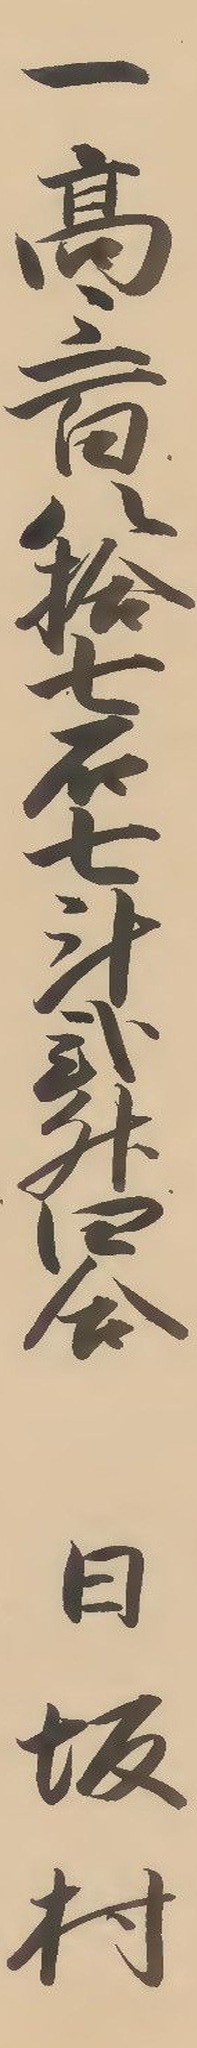一高三百八拾七石七斗弐升四合日坂村
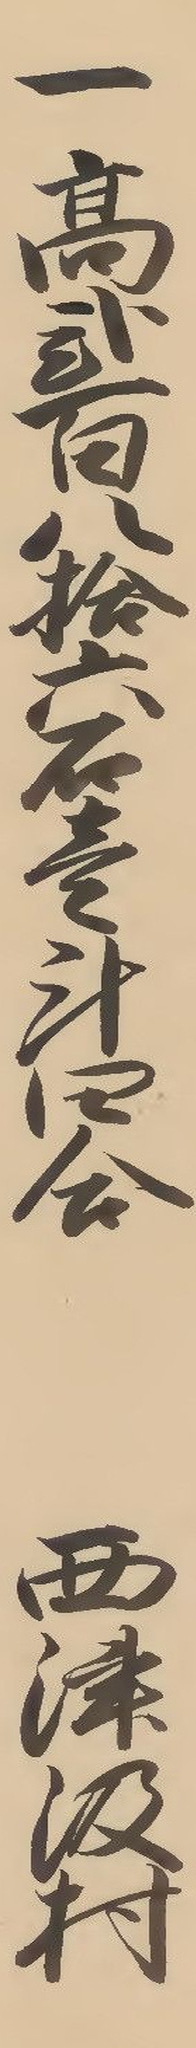一高弐百八拾六石壱斗四合西津汲村
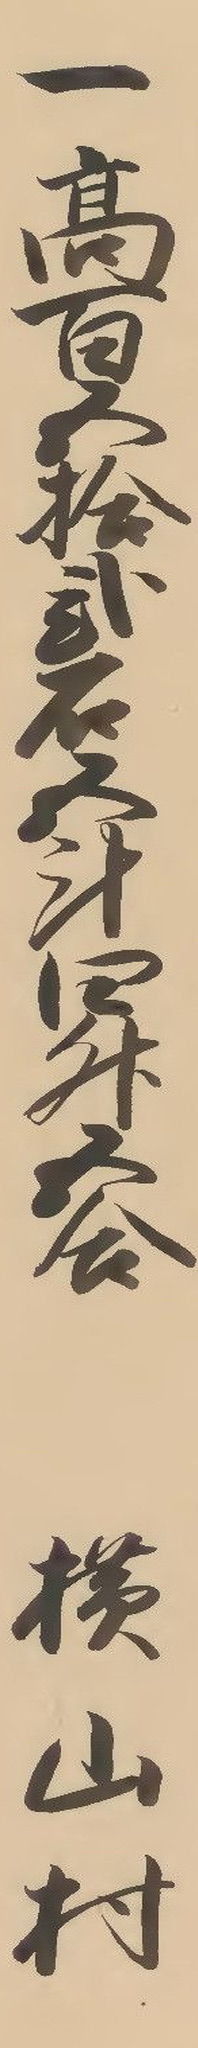一高百五拾弐石五斗四升五合横山村
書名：美濃国郷帳
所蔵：国立公文書館 National Archives of Japan
